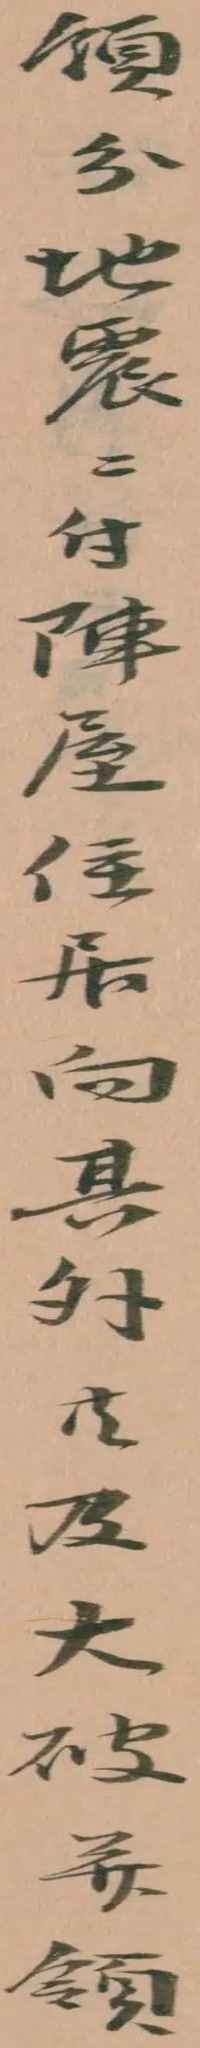領分地震二付陣屋住居向其外共及大破并領
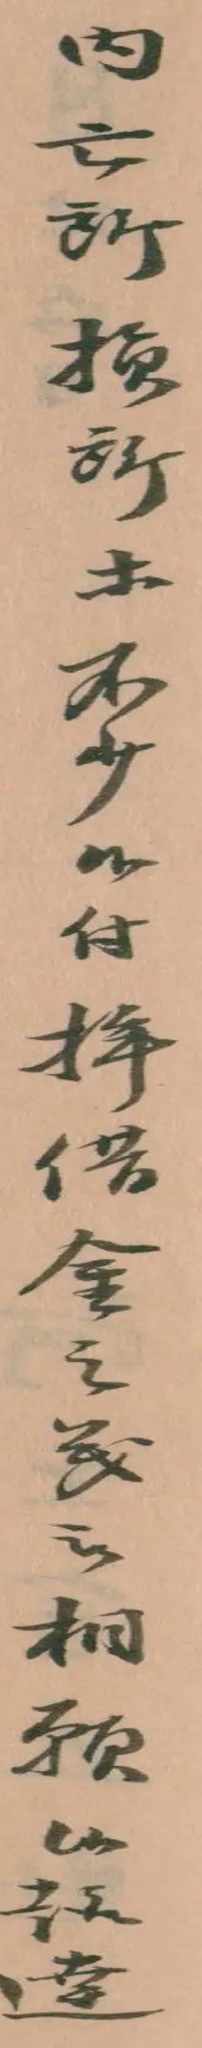内亡所損所等不少候付拝借之儀被相願候趣達
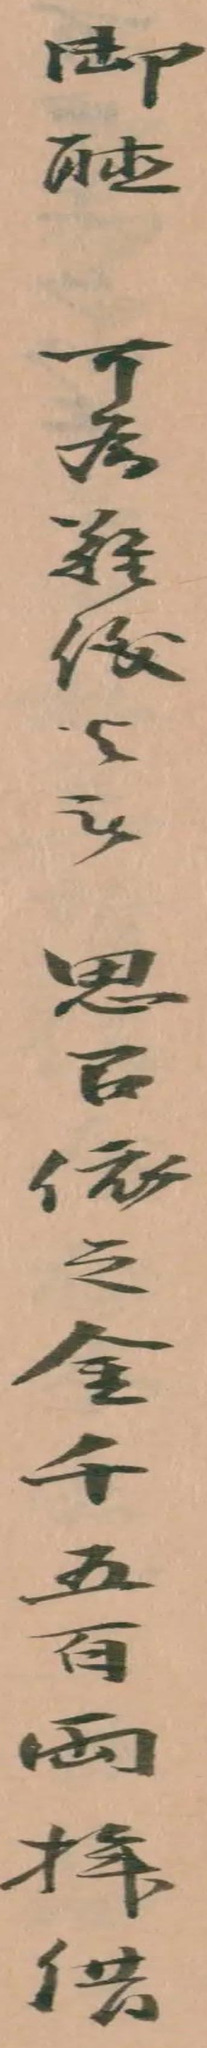御聴可為難儀と被思召候依之金子五百両拝借
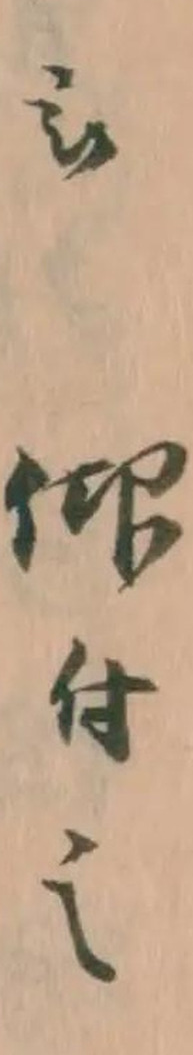被仰付之
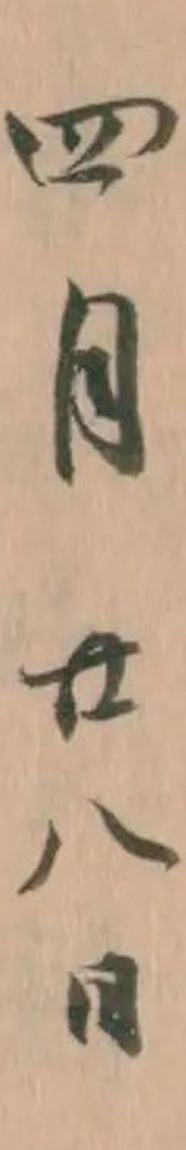四月廿八日
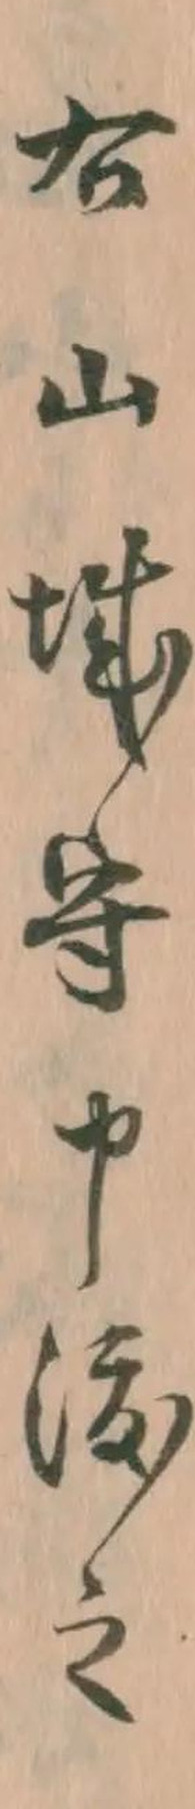右山城守申渡之
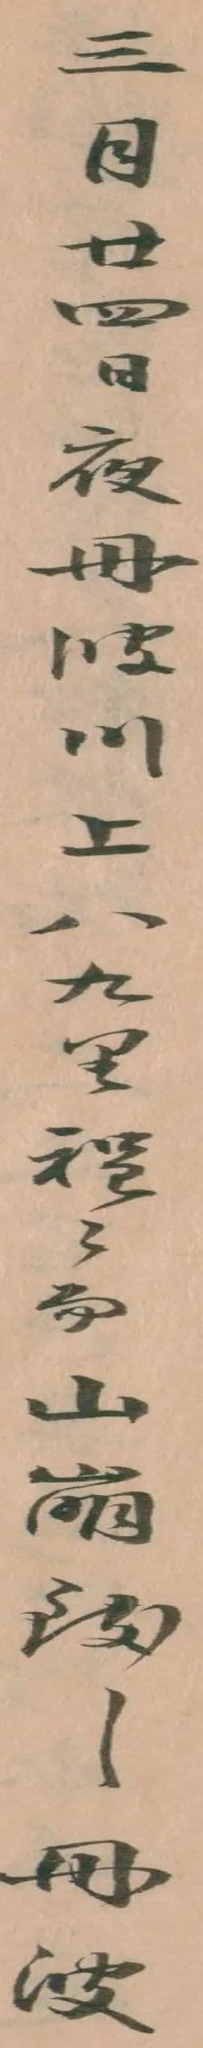三月廿四日夜丹波川上八九里程二而山崩致し丹波
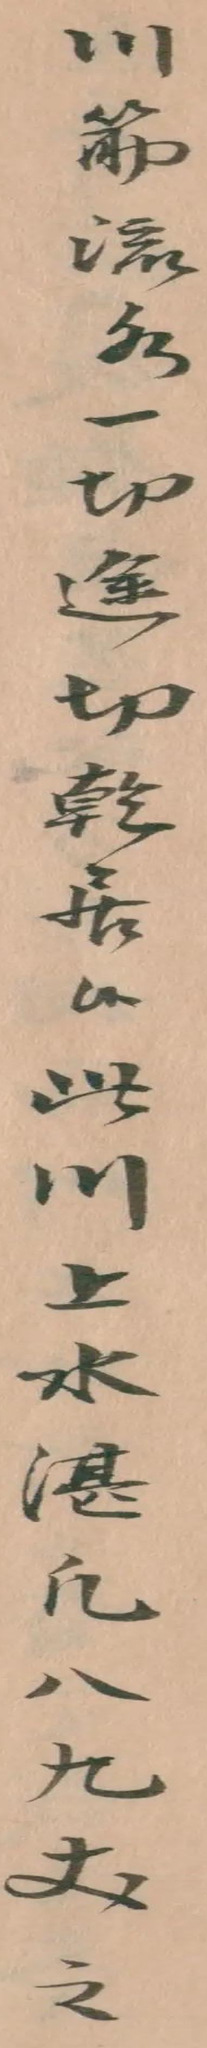川筋流水一切途切乾居候此川上水湛凡八九丈之
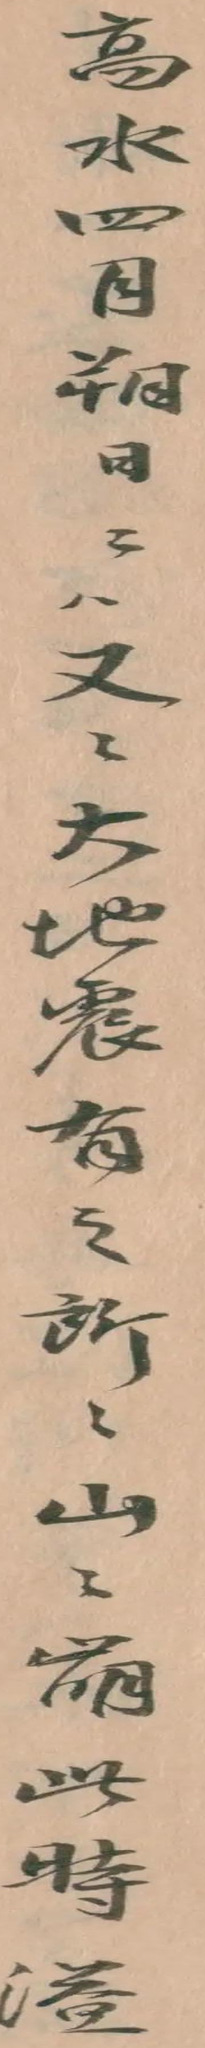高水四月朔日二ハ又々大地震有之所々山々崩此時溢
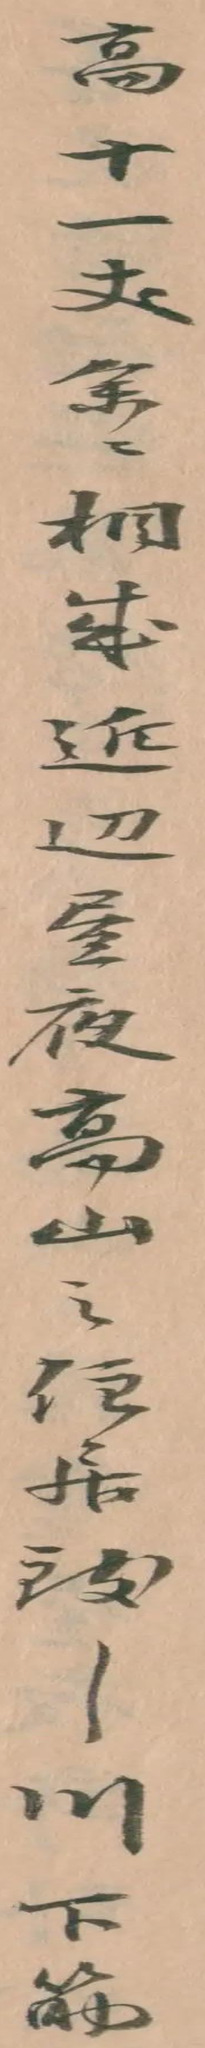高十一丈余二相成近辺昼夜高山之住居致し川下筋

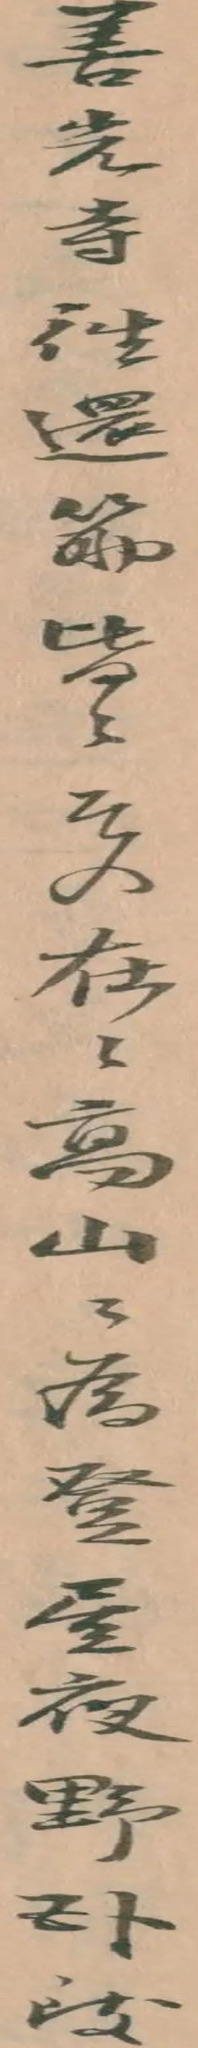善光寺往還筋皆々その在々高山二為登昼夜野臥致
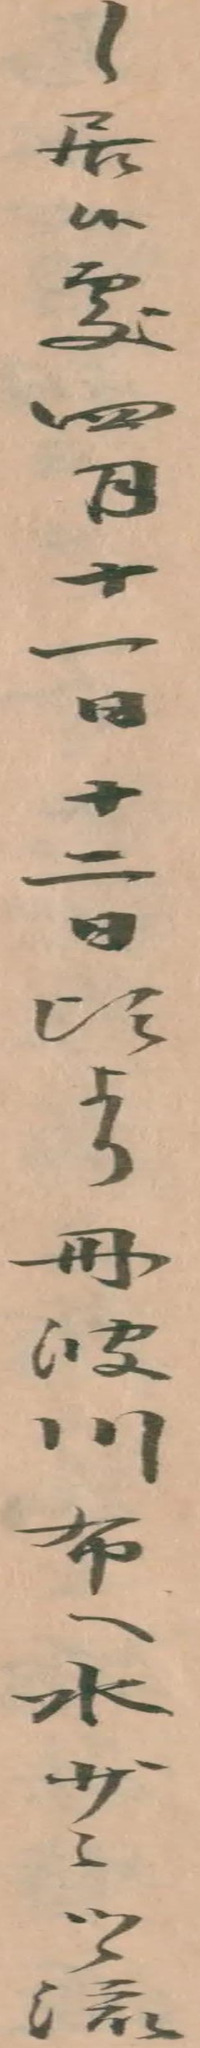し居候処四月十一日十二日頃より丹波川筋へ水少々ツ丶流
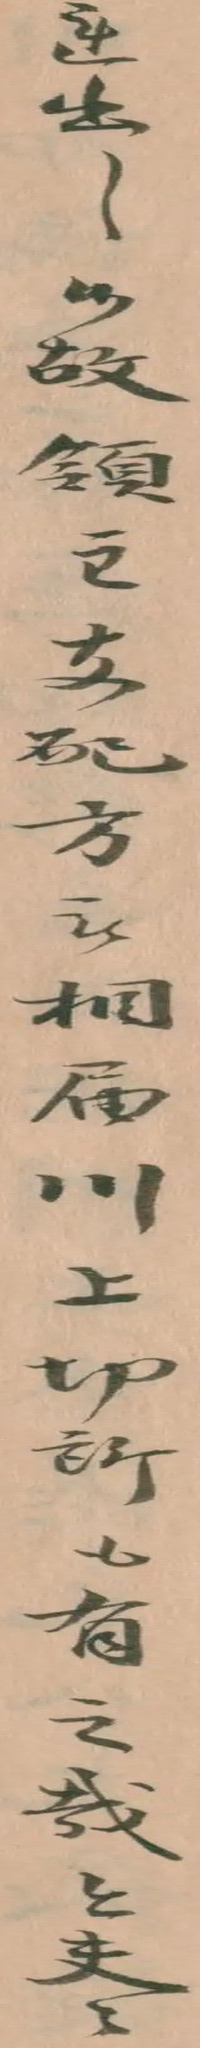れ出し候故領主支配方江相届川上切所も有之哉と夫々
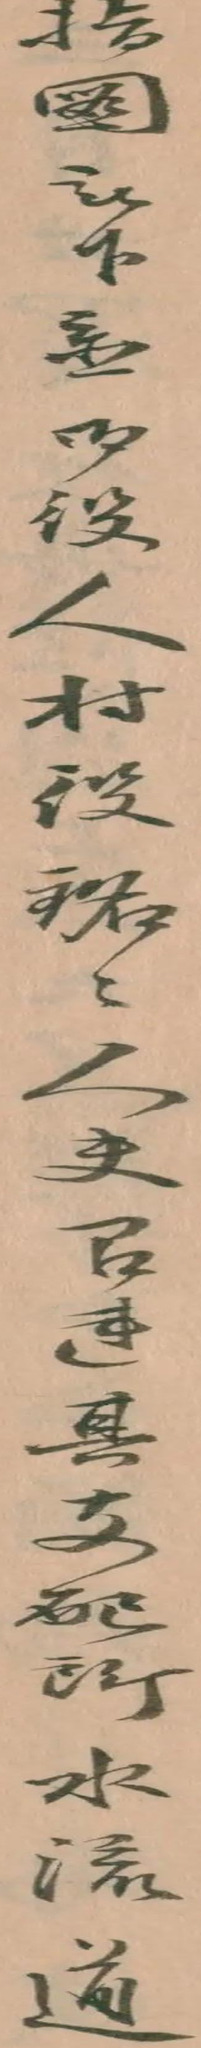指図被下置御役人村役銘々人夫召連其支配所水流道
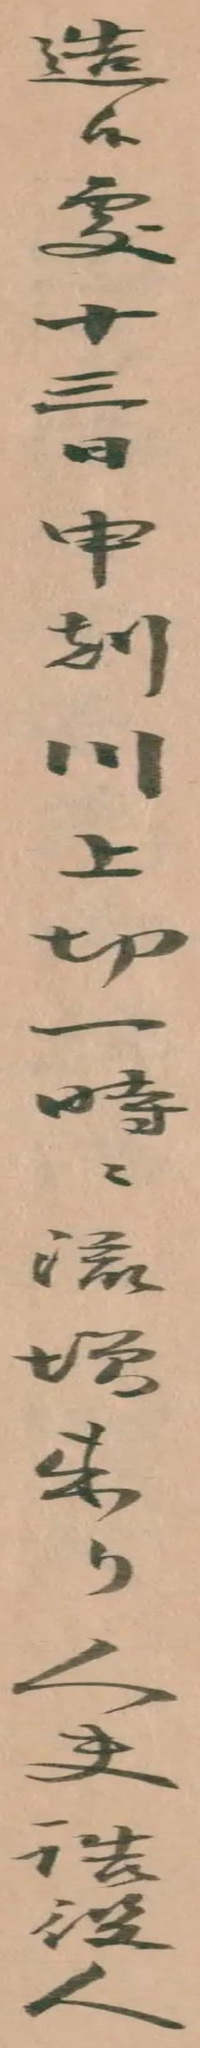造候処十三日申刻川上切一時二流増来り人夫諸役人
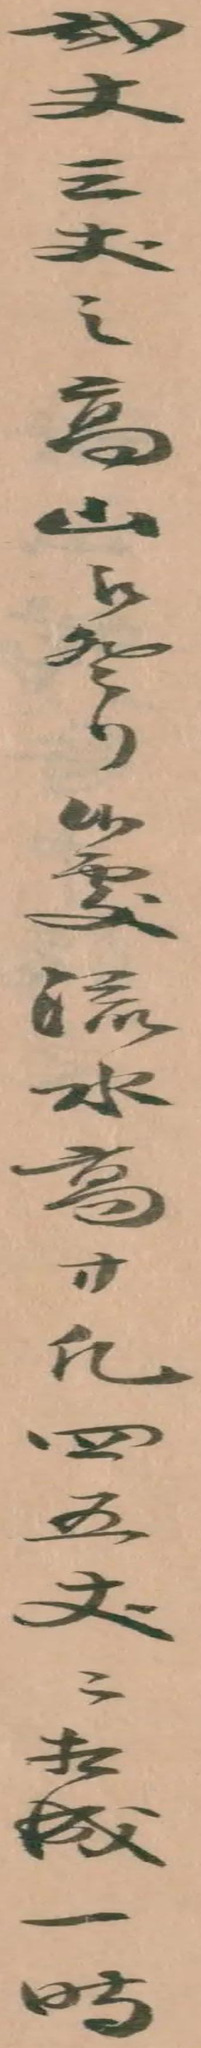弐丈三丈之高山へ登り候処流水高サ凡四五丈二相成一時
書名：地災撮要. 巻3(地震之部)-巻4(噴火之部)
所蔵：国立国会図書館 National Diet Library, JAPAN
